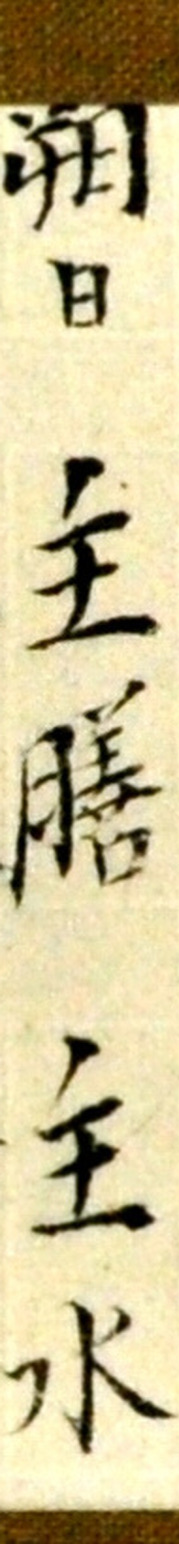朔日主膳主水
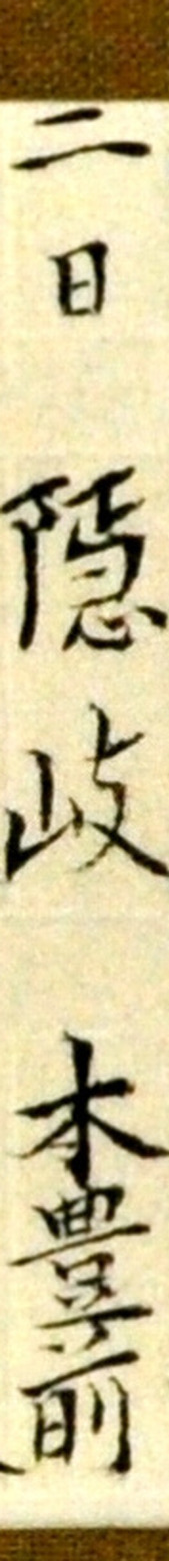二日隠岐本豊前
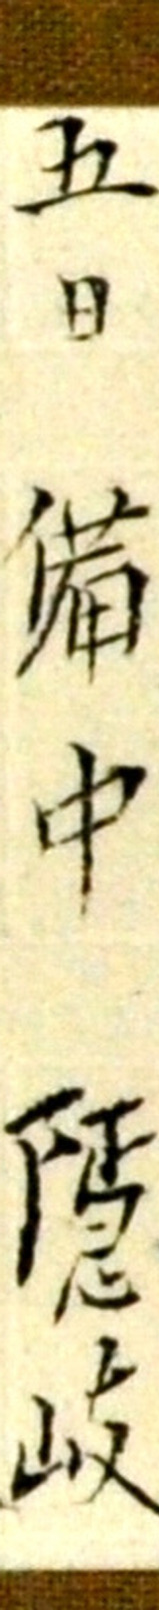五日備中隠岐
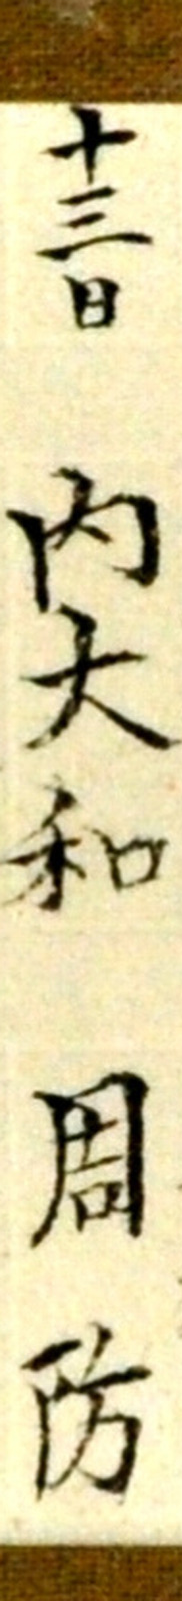十三日内大和周防
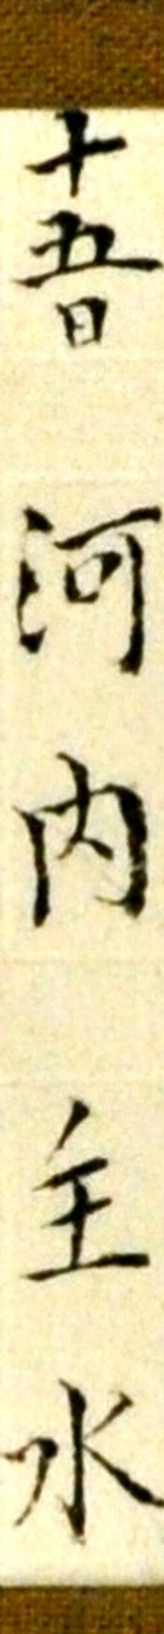十五日河内主水
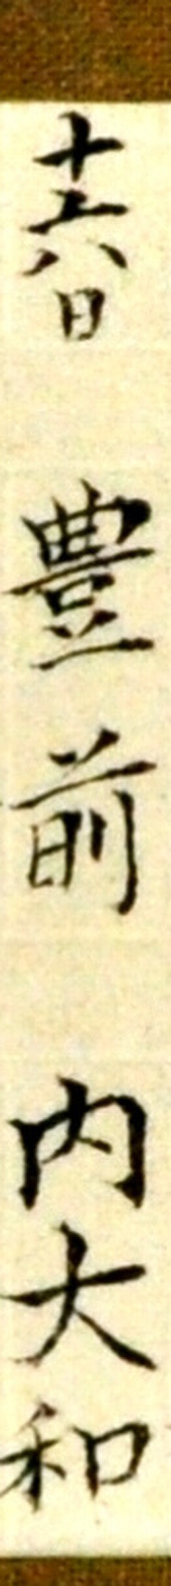廿六日豊前堀大和
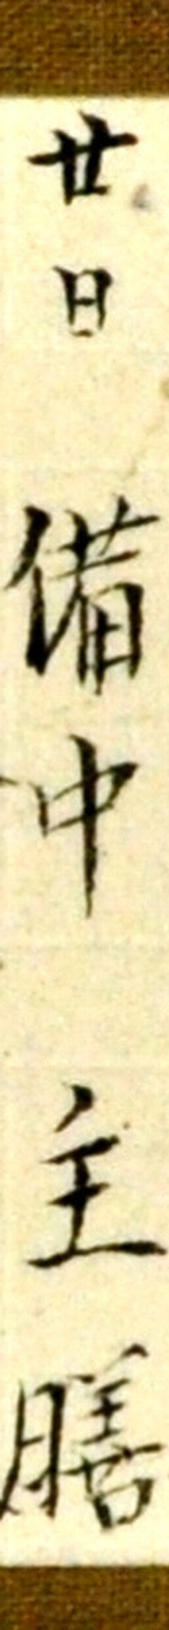廿九日備中主水
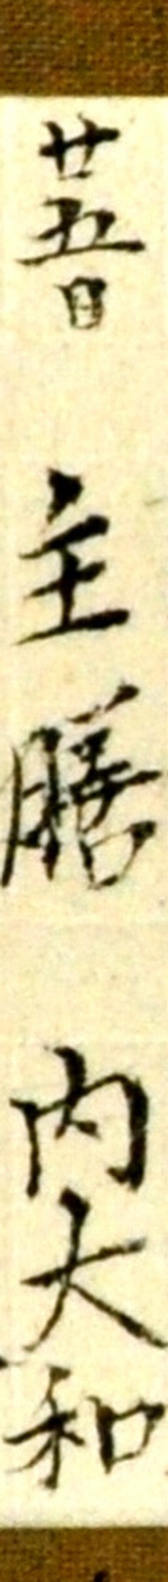廿五日主膳内大和
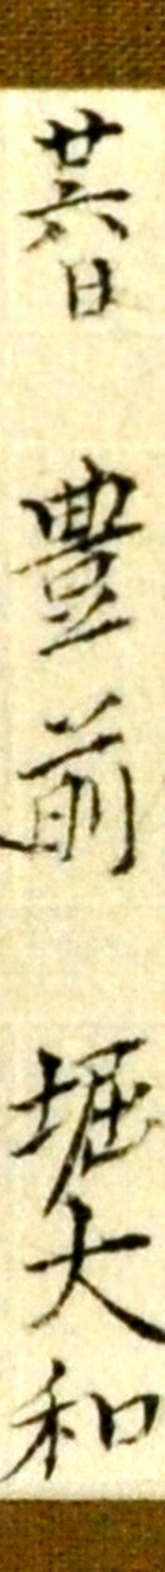廿六日豊前堀大和
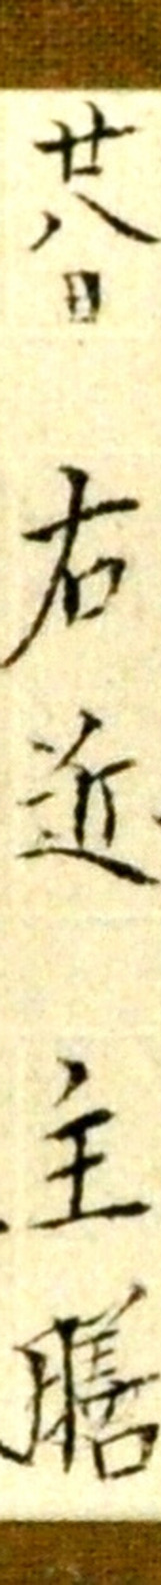廿八日右近主膳
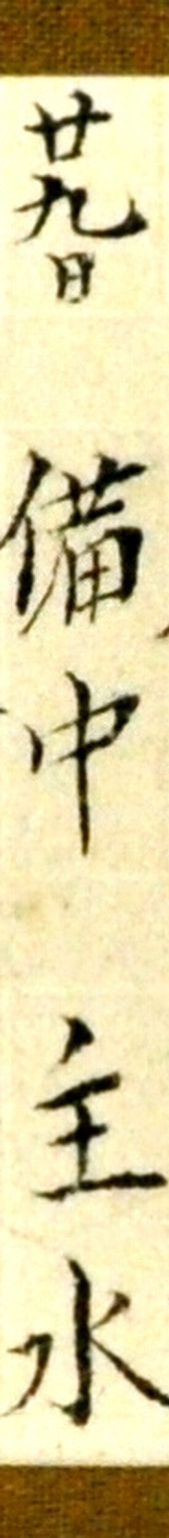廿九日備中主水
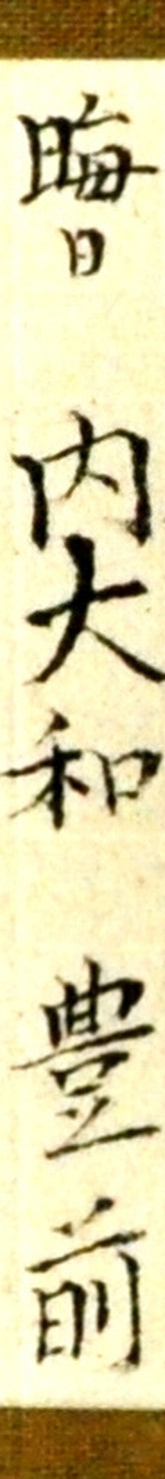晦日内大和豊前

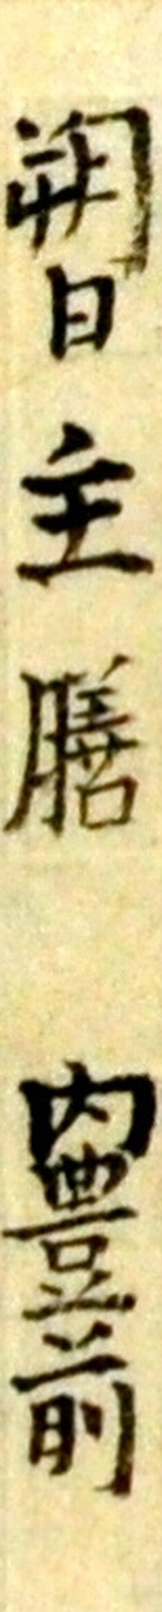朔日主膳内豊前
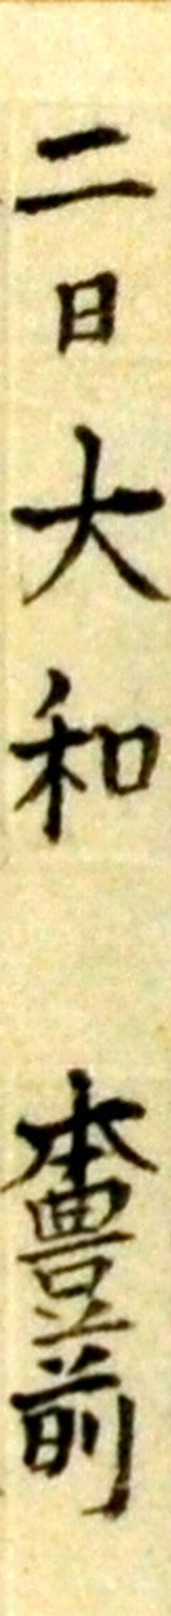二日大和本豊前
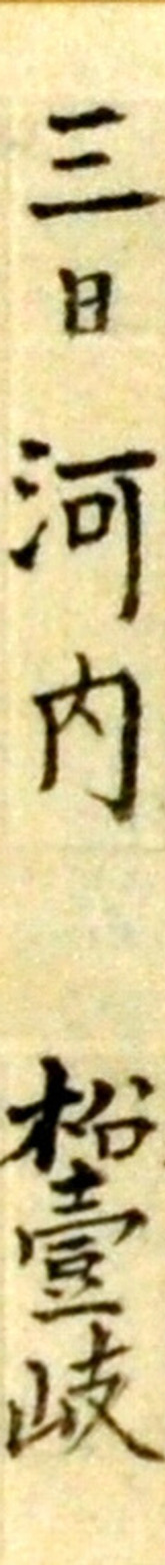三日川地松壱岐
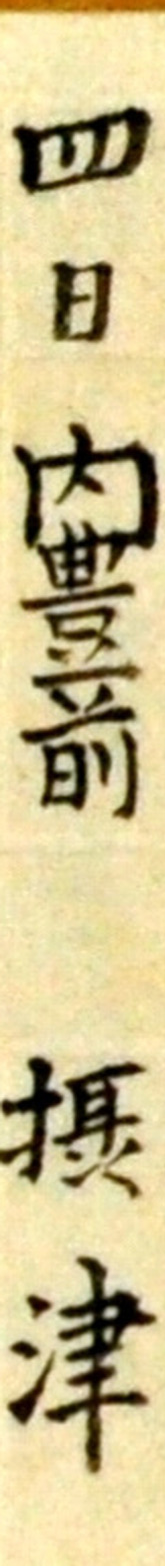四日内豊前摂津
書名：六月・八月詰日一覧
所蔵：伊那市立高遠町図書館・合同会社AMANE
